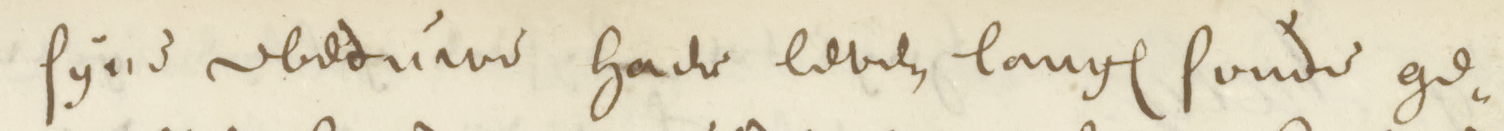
sijne weduwe haer leven langh soude ge,,
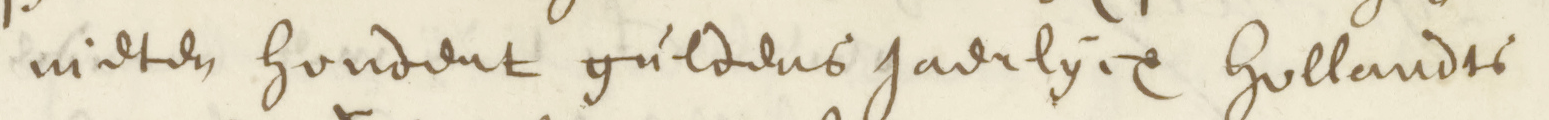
nieten hondert guldens jaerlijcx hollandts
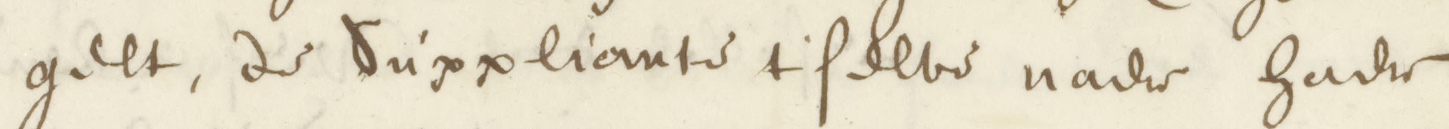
gelt, de Suppliante t'selve naer haer
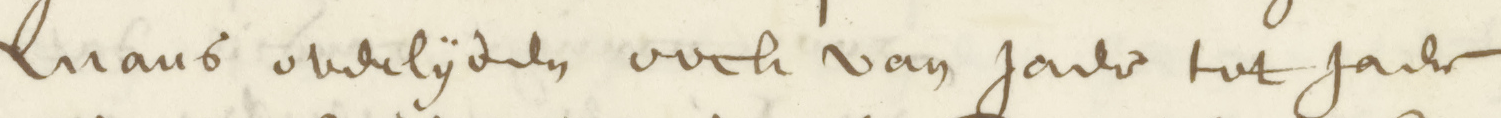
mans overlijden oock van jaer tot jaer
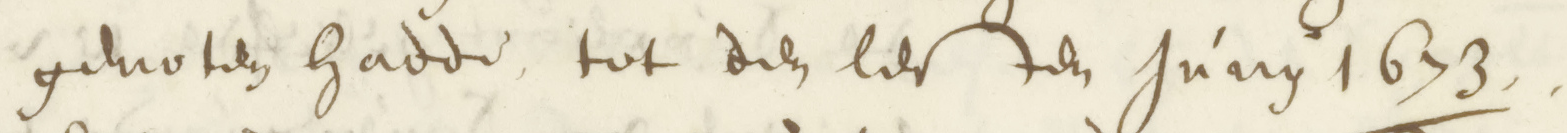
genoten hadde, tot den lesten Junij 1673.
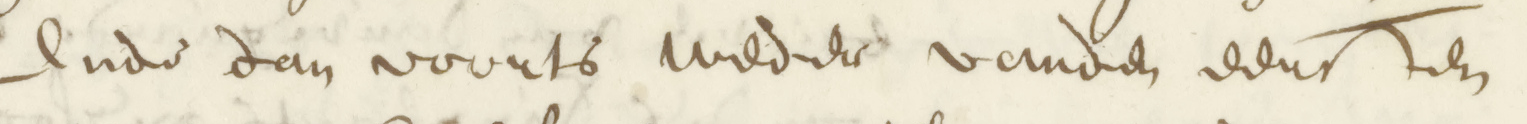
Ende dan voorts weder vanden eersten
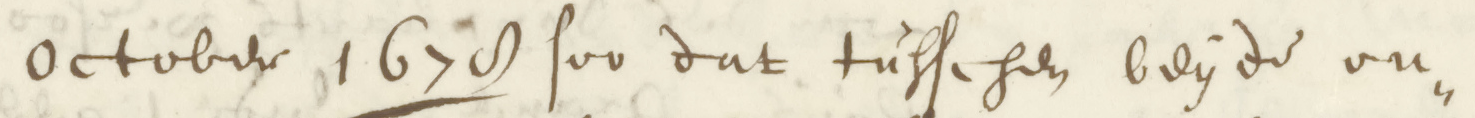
october 1678 soo dat tusschen beijde on,,
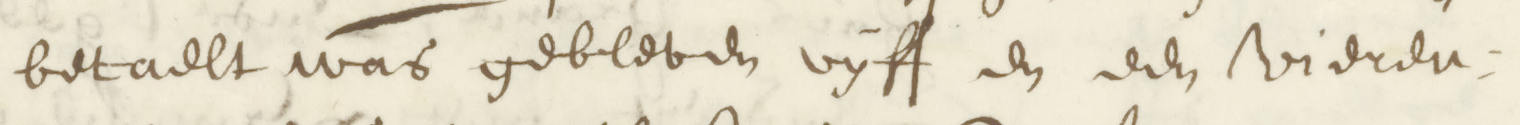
betaelt was gebleven vijff en een vieren,,
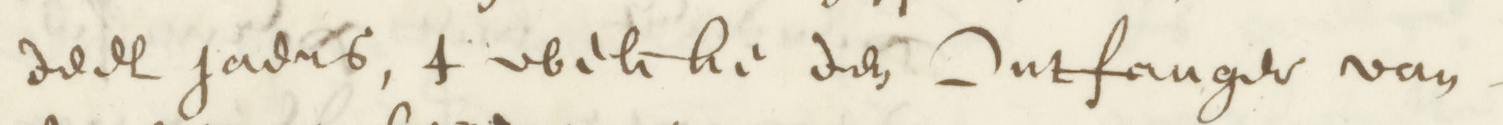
deel jaers, t'welcke den Ontfanger van
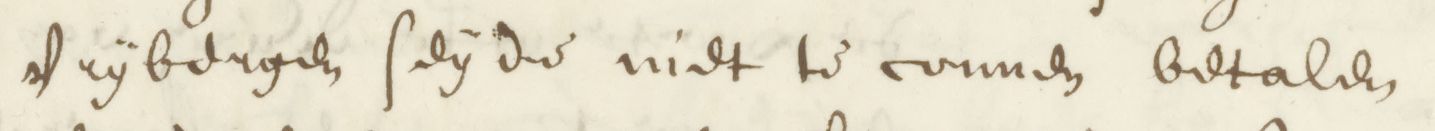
Vrijbergen seijde niet te connen betalen
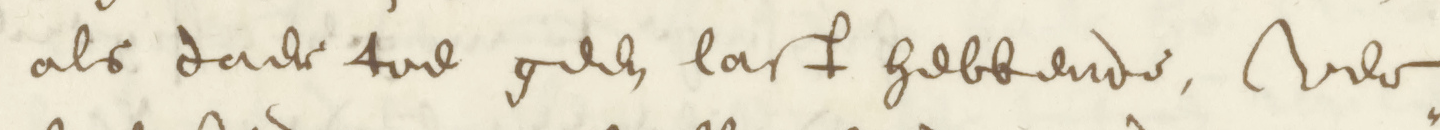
als daer toe geen last hebbende. Ver,,
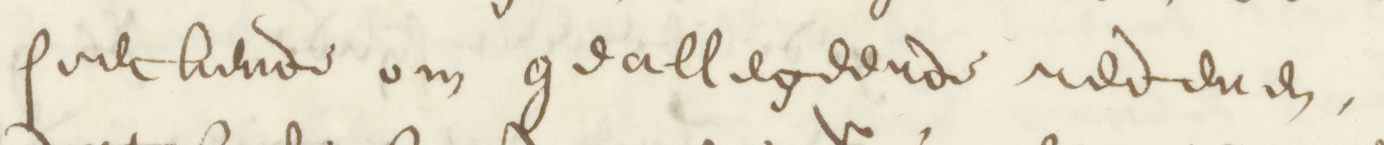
soeckende om geallegeerde redenen,
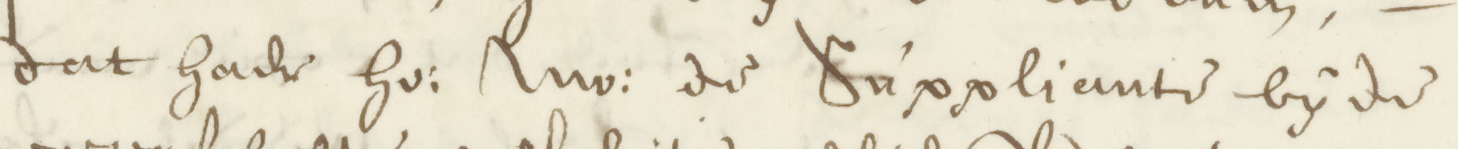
dat haer ho:mo: de Suppliante bij de
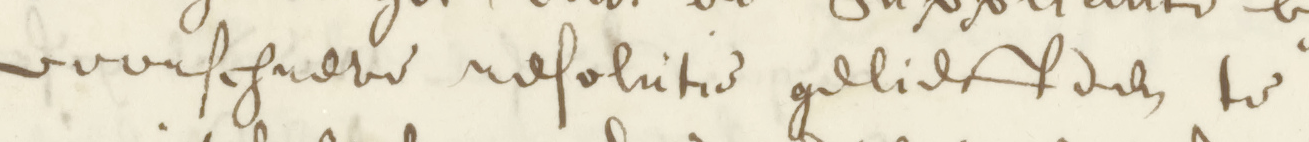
voorschreve resolutie gelieffden te
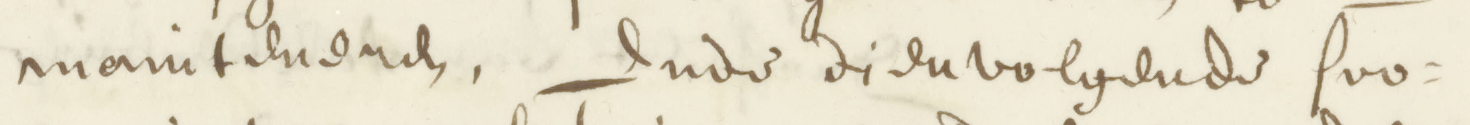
mainteneren, ende dienvolgende soo=
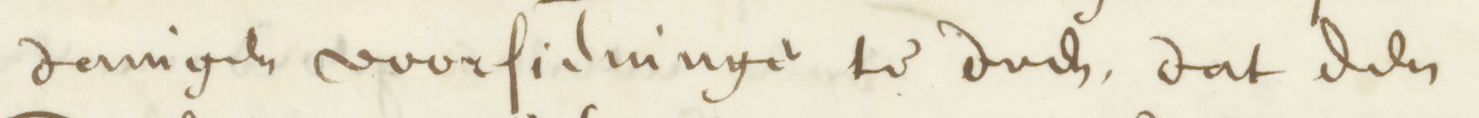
danigen voorsieninge te doen, dat den
